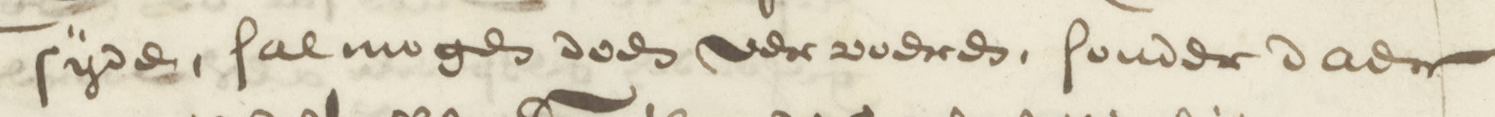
sijde, sal mogen doen vervoeren, sonder daer
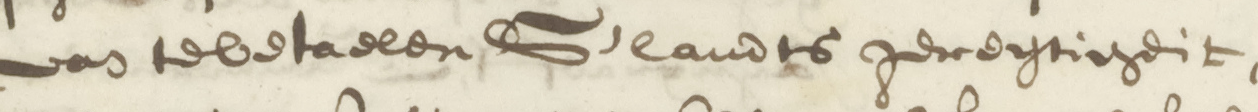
van te betaelen S‛ landts geregticheit, ¬
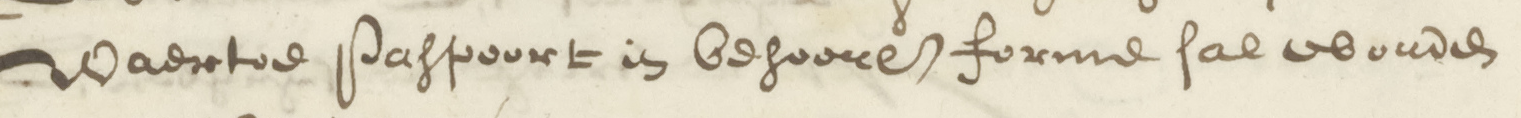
Waertoe Paspoort in behoorl forme sal worden
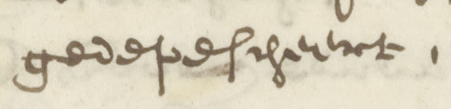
gedepescheert.
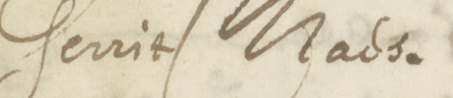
Gerrit Maes.
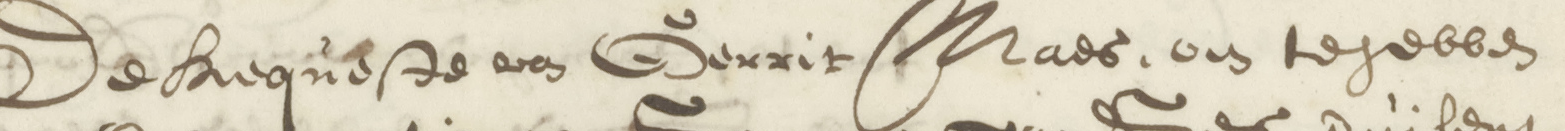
De Requeste van Gerrit Maes, om te hebben
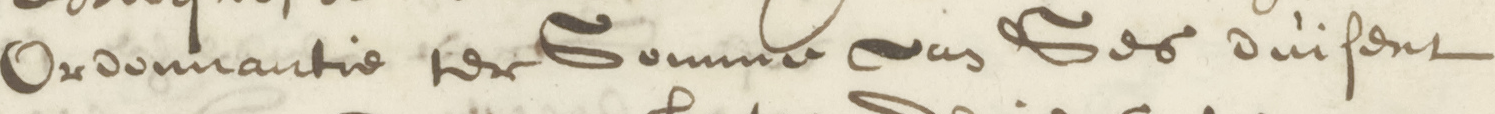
Ordonnantie ter Somme van Ses duisent
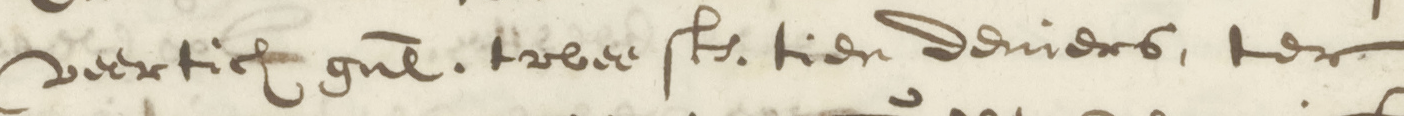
veertich gul. twee sts. tien deniers, ter
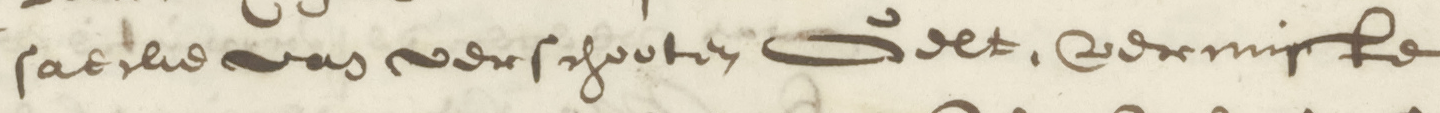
saecke van verschooten Gelt, vermiste
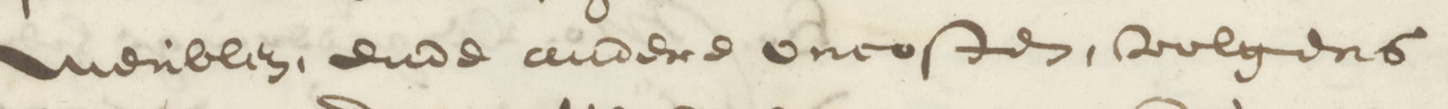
meublen, ende andere oncosten, volgens ¬
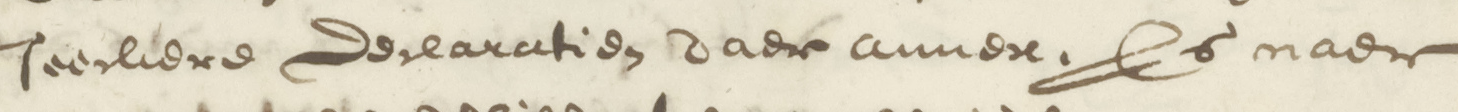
seeckere Declaratien daer annex. Is naer
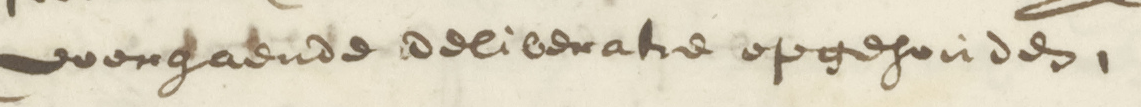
voorgaende deliberatie opgehouden.
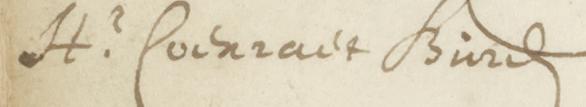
Hr. Coenraet Burch.
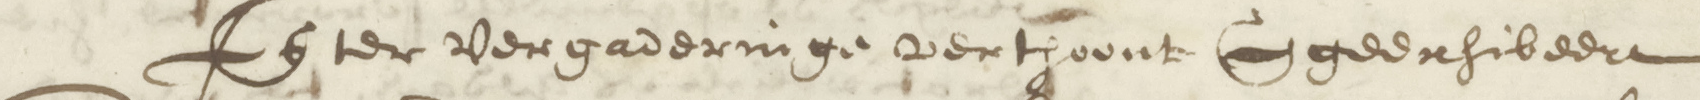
Is ter Vergaderinge verthoont & geexhibeert
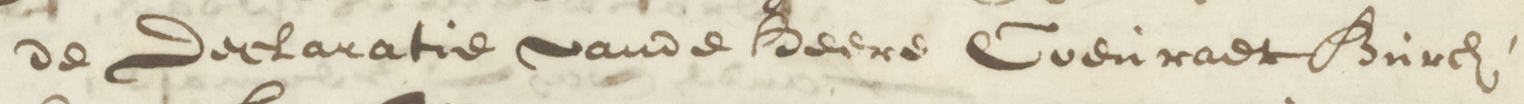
de Declaratie vande Heere Coenraet Burch,
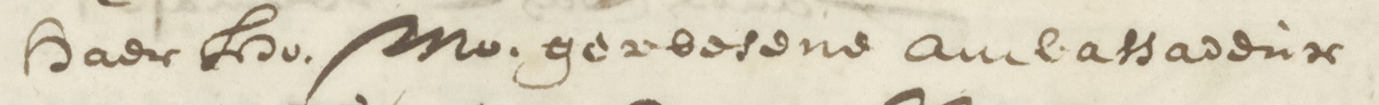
haer Ho.Mo. gewesene Ambassadeur ¬
